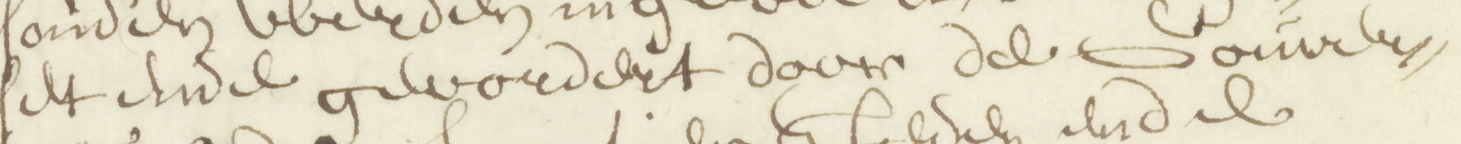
set ende gevordert door de Gouver„
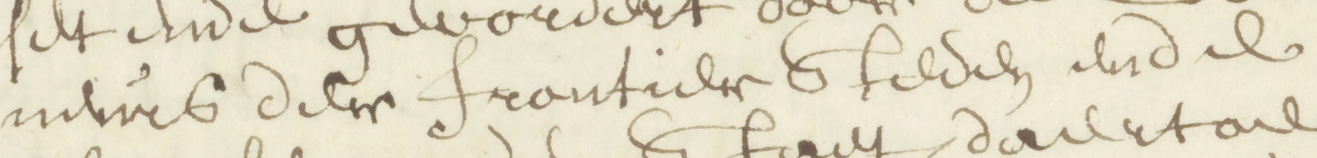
neurs der frontier Steden ende
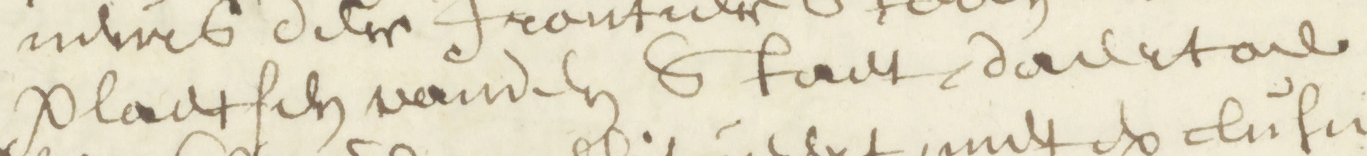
plaetsen vanden Staet, daertoe
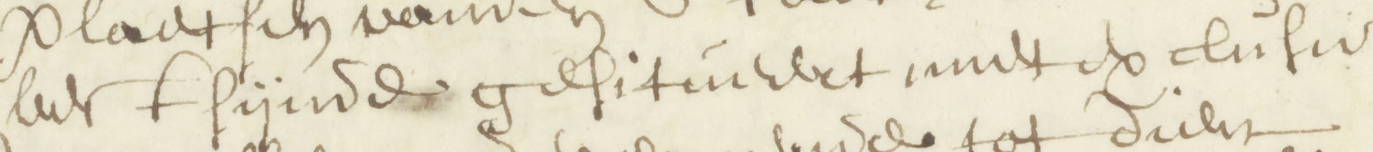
best sijnde gesitueert, met exclusie
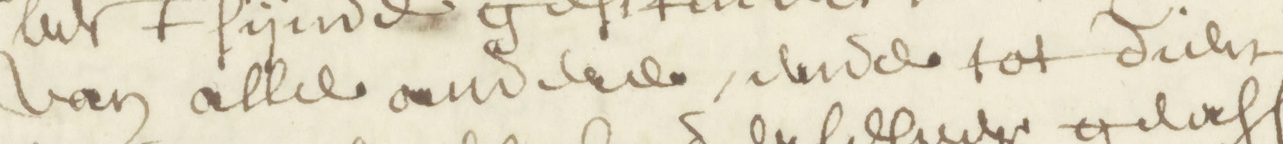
van alle andere, ende tot dien
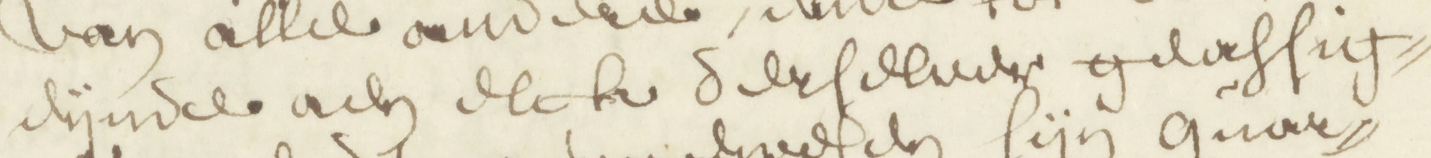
eijnde aen elck derselver geassig„
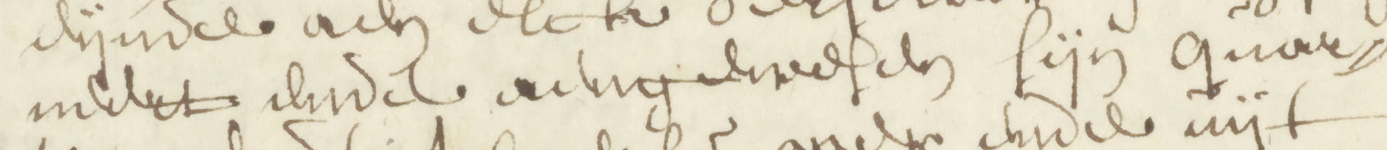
neert ende aengewesen sijn quar„
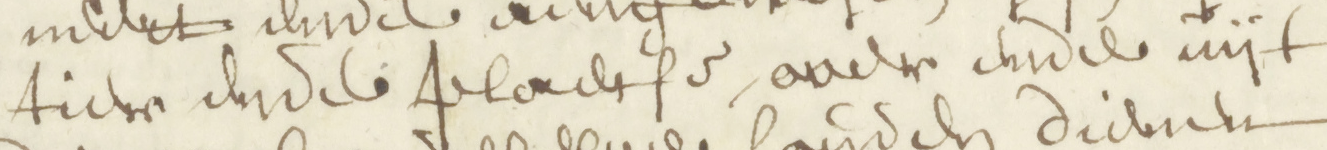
tier ende plaetse, over ende uijt
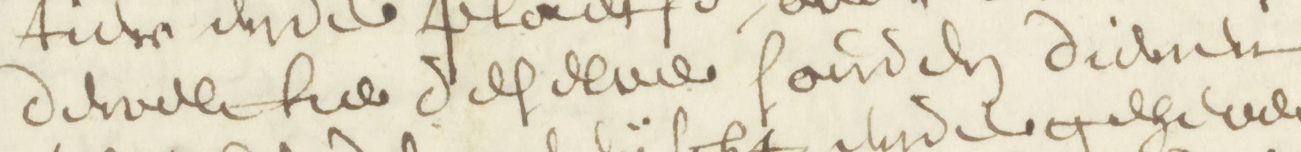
dewelcke deselve souden dienen
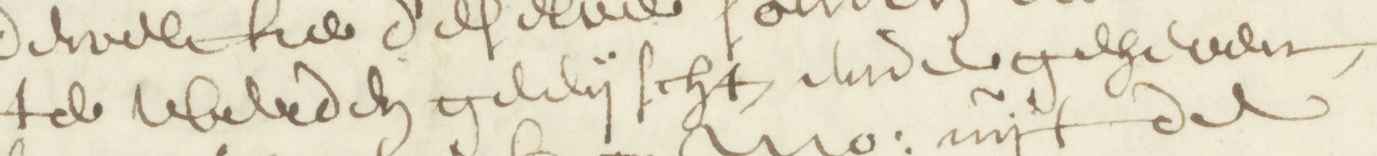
te werden geeijscht, ende geheven,
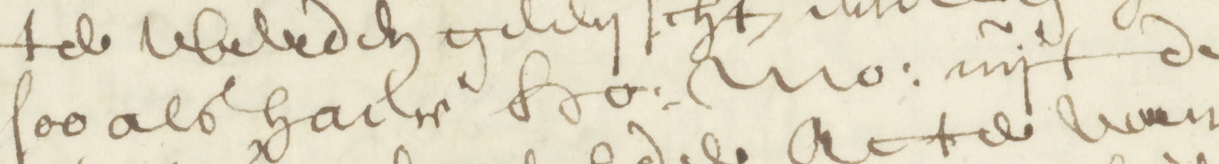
soo als haer Ho:Mo: uijt de
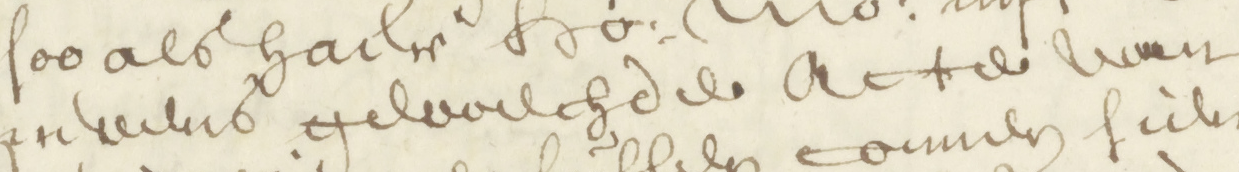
nevens gevoechde Acte van
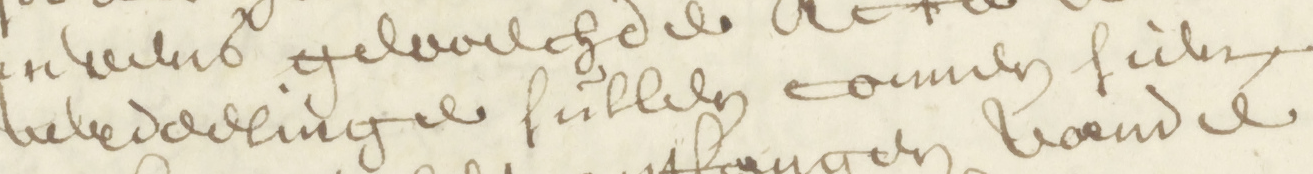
verdeelinge sullen connen sien,
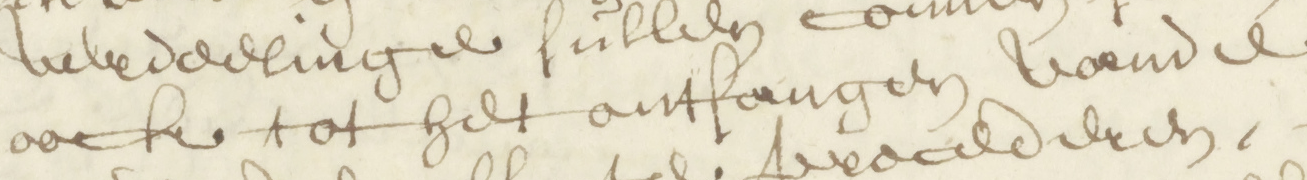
oock tot het ontfangen vande
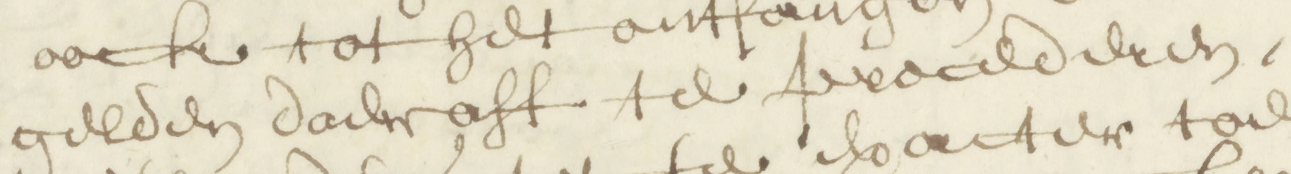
gelden daeraff te procederen,
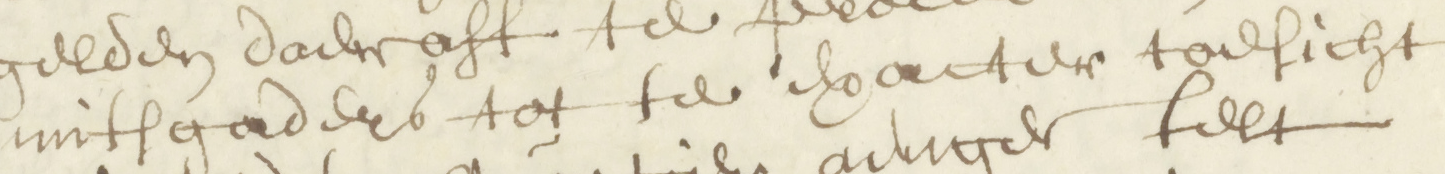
mitsgaders tot te exacter toesicht
